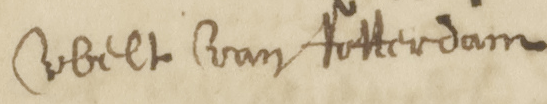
welt van Rotterdam
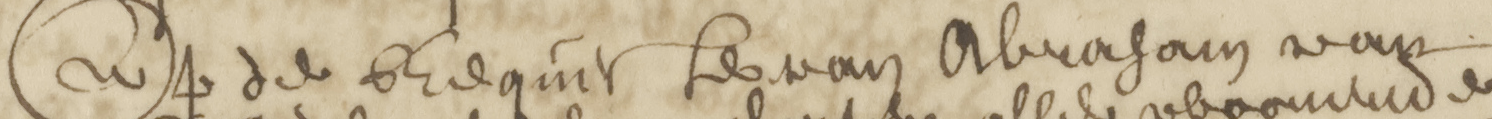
Op de Requeste van Abraham van
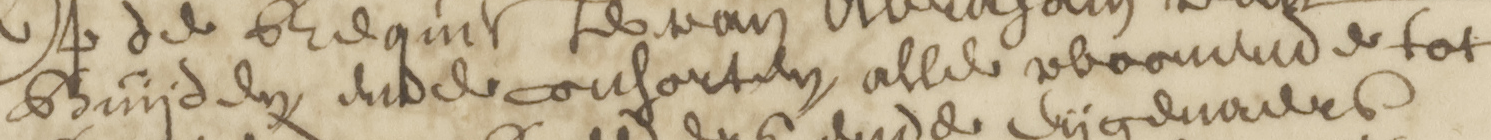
Buijden, ende consorten, alle woonende tot
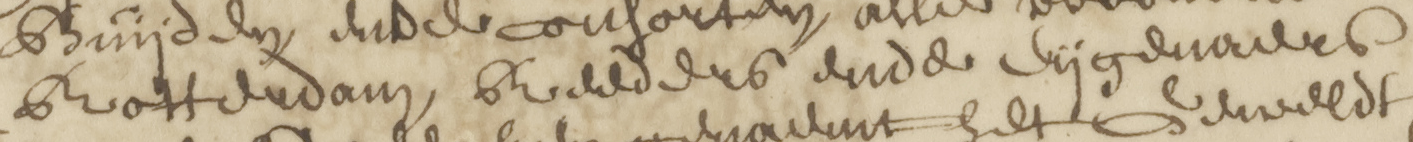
Rotterdam, Reeders ende Eijgenaers
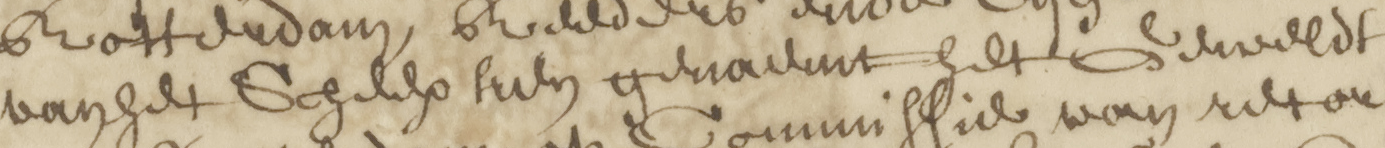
vanhet Scheepken genaemt het Geweldt
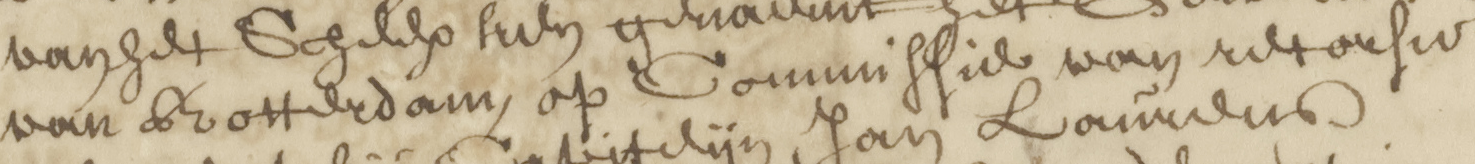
van Rotterdam, op Commissie van retorsie
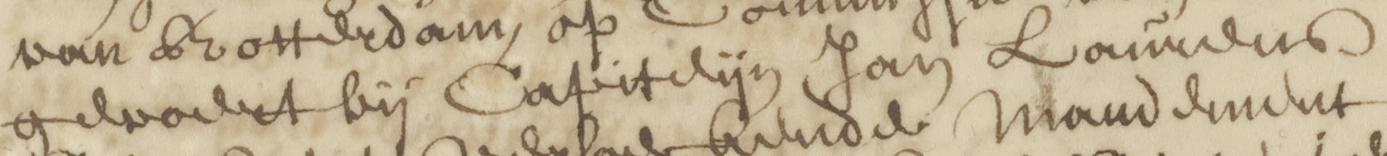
gevoert bij Capiteijn Jan Larens
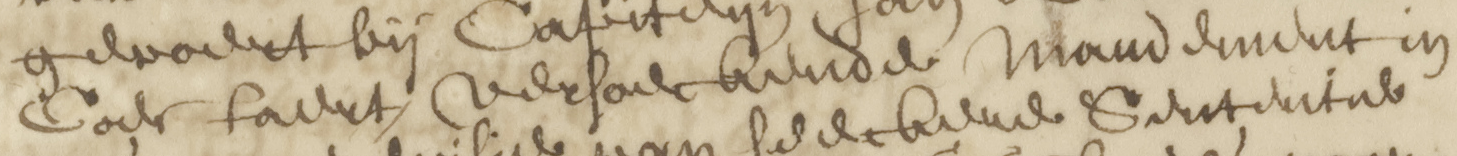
Coestaert, versoeckende Mandement in
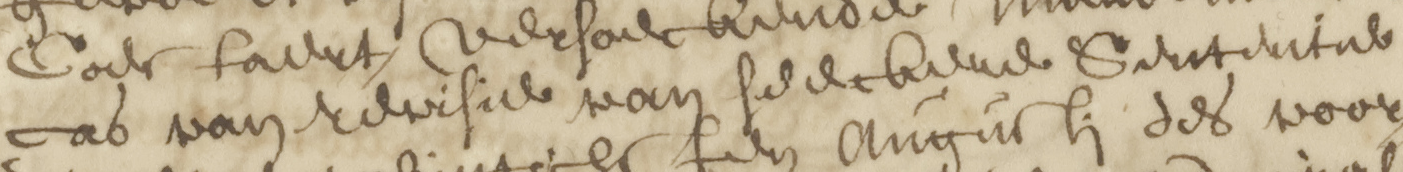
cas van revisie van seeckere Sententie
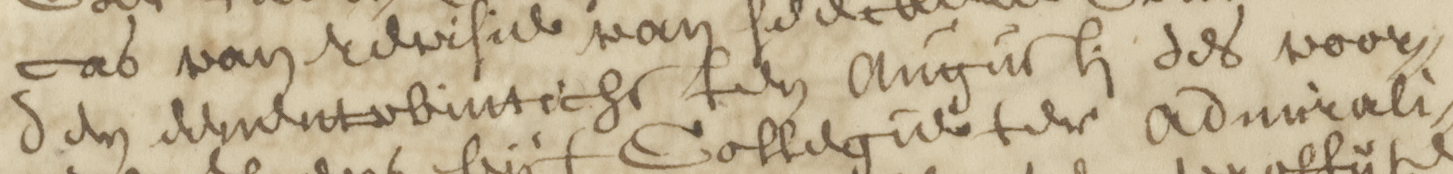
den eenentwintichsten Augusti des voor„
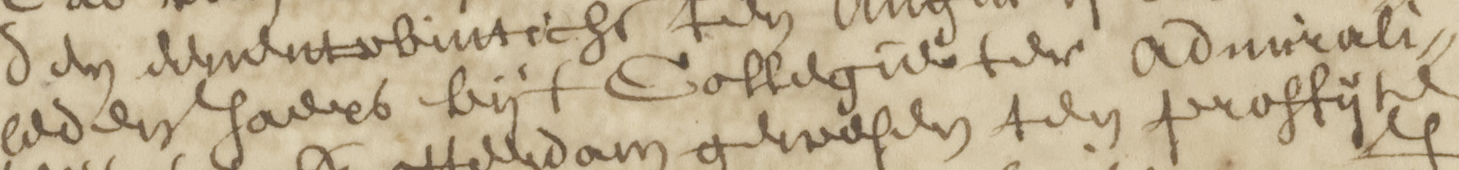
leden Jaers bij‛t Collegie ter Admirali„
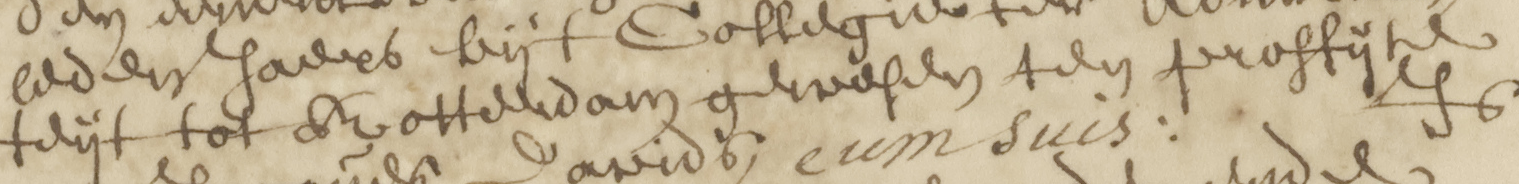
teijt tot Rotterdam gewesen ten proffijte
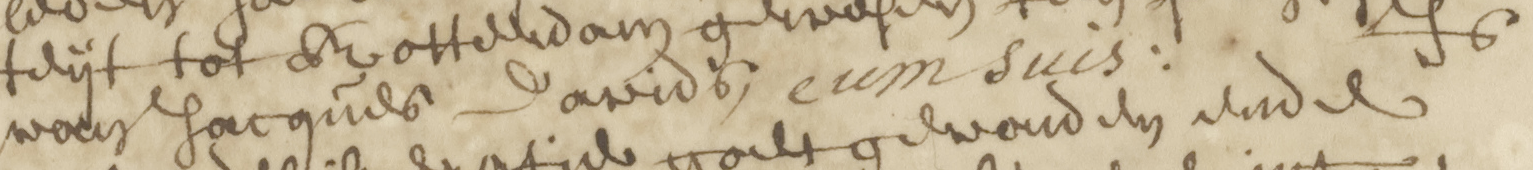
van Jacques Davids, cum suis: Is
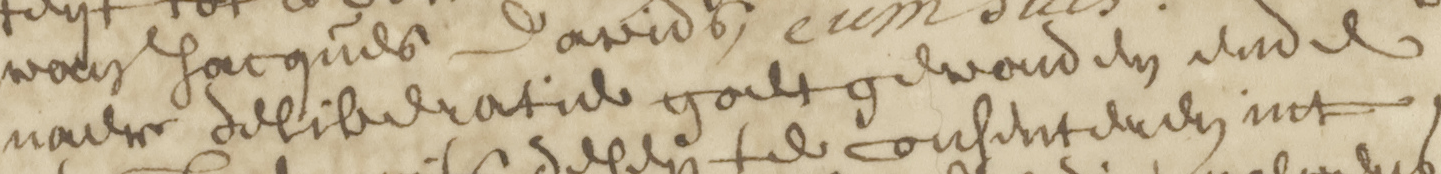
naer deliberatie goetgevonden ende
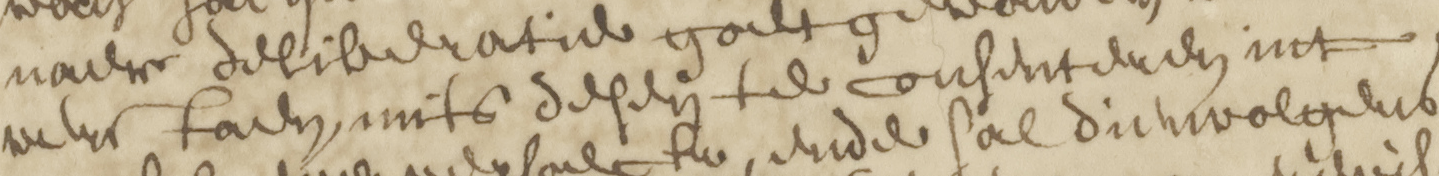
verstaen, mits desen te consenteren int
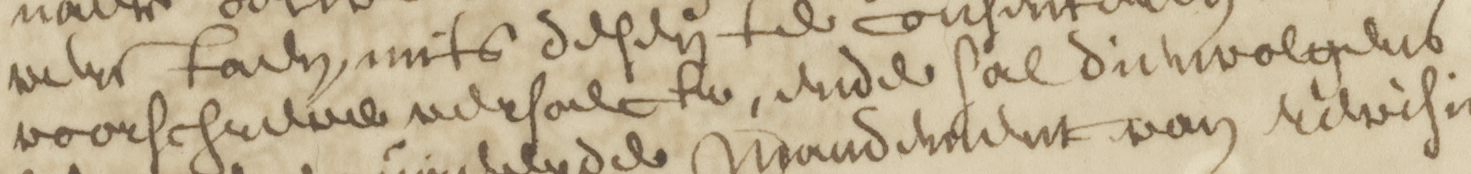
voorschreve versoeck, ende sal dienvolgens
